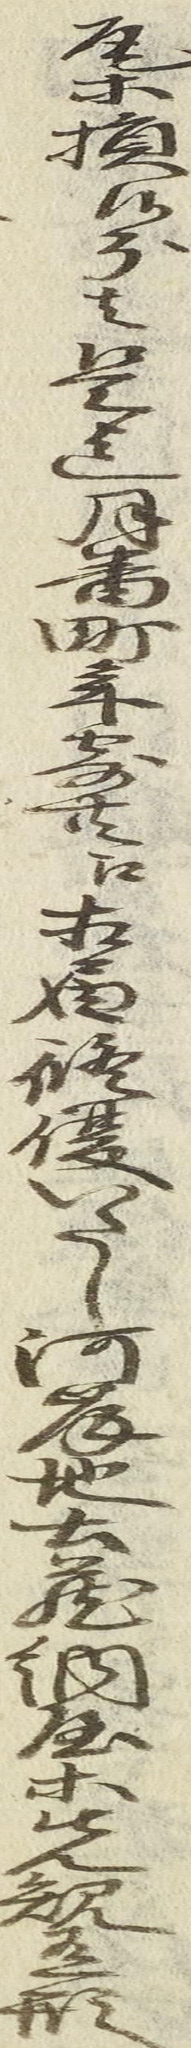瓦抔損候分者是迄月番町年寄共江相届修復いたし河岸地土蔵納屋等先規有形
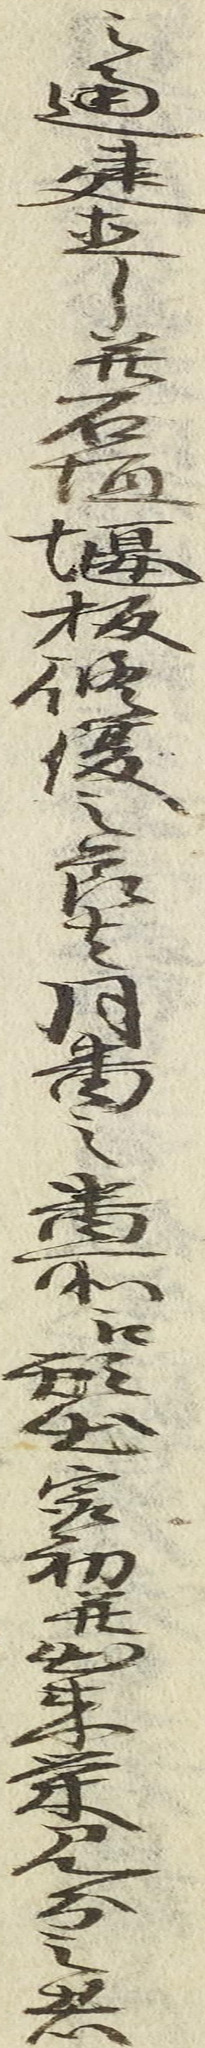之通建直し幷石垣堰板修復之節者月番之番所江願出最初幷出来栄見分之者
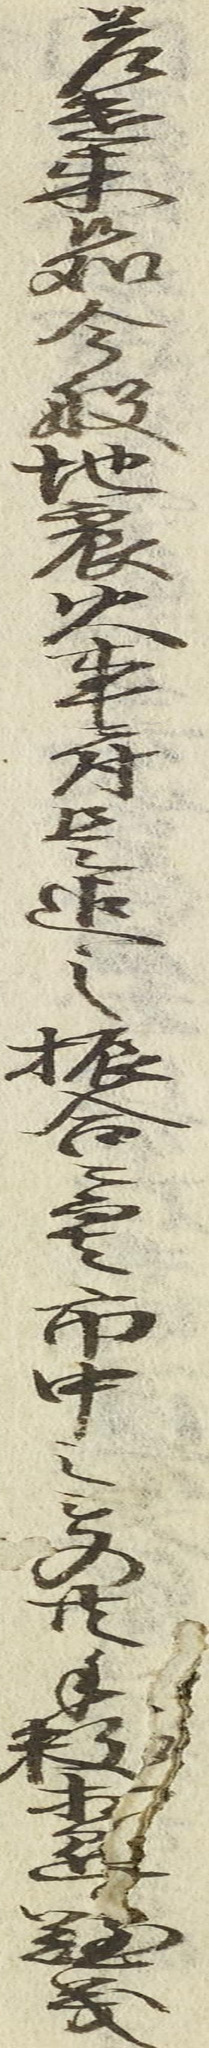差遣来候処今般地震火事ニ付是迄之振合ニ而者市中之もの共手数等懸り難義
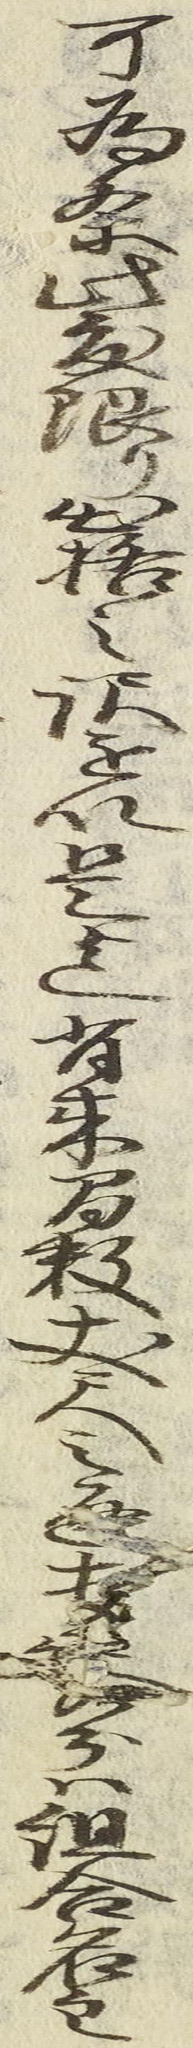可為条此度限り出格之訳を以是迄有来間数丈尺之通相糺候分は組合名主
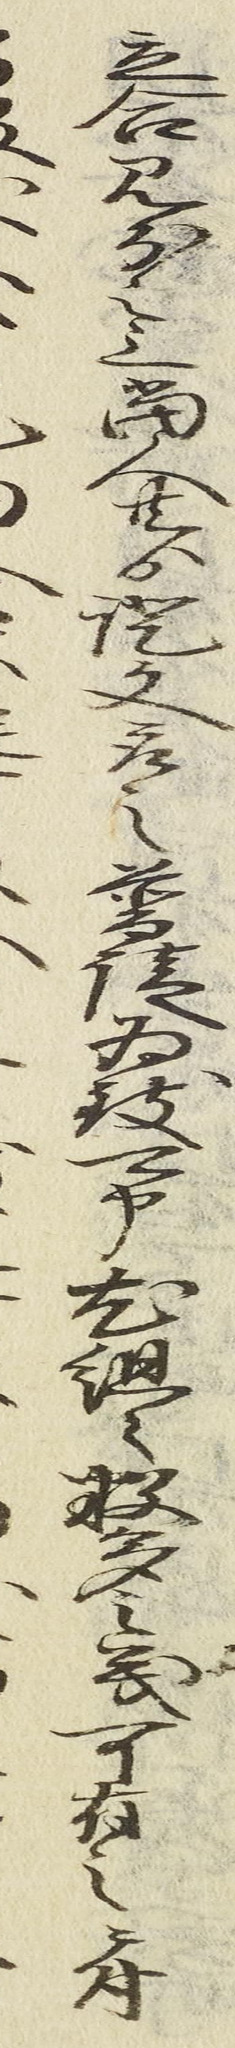立合見分之上当人共ゟ証文取之普請為致可申尤組之数多之義可有之ニ付
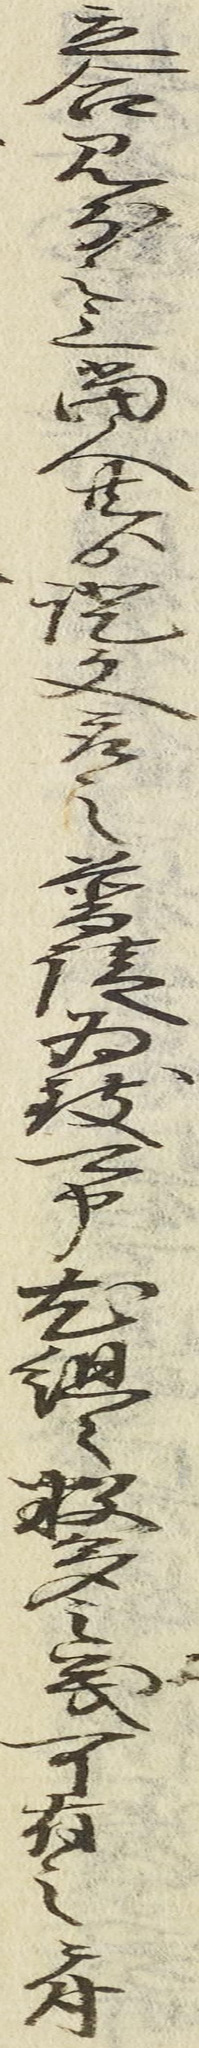立合見分之上当人共ゟ証文取之普請為致可申尤組之数多之義可有之ニ付
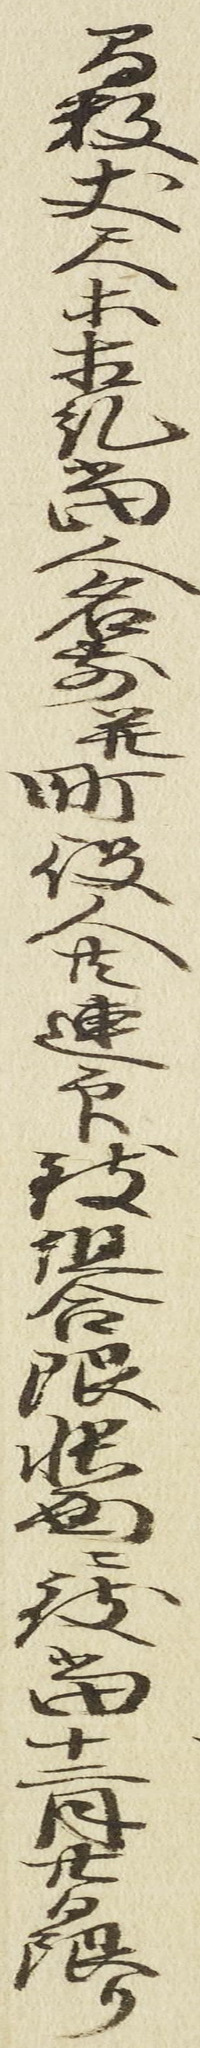間数丈尺等相糺当人名前幷町役人共連印致組合限帳面ニ致当十二月廿日限り
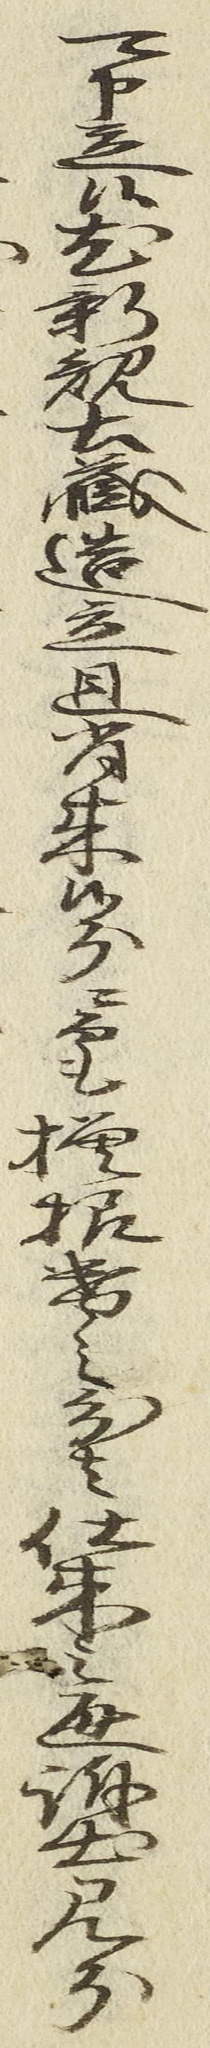可申立候尤新規土蔵造立且有来候分ニ而も模様常々之分者仕来之通訴出見分
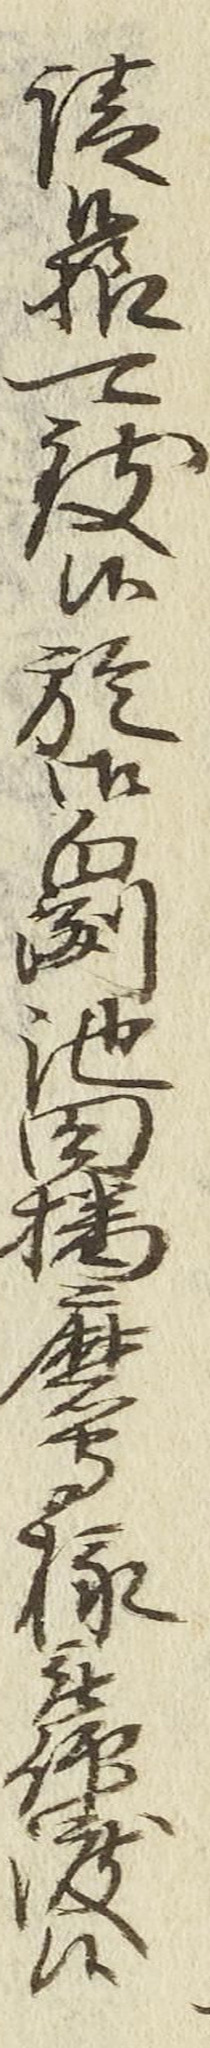請候様可致候御御白洲池田播磨守様被仰渡候
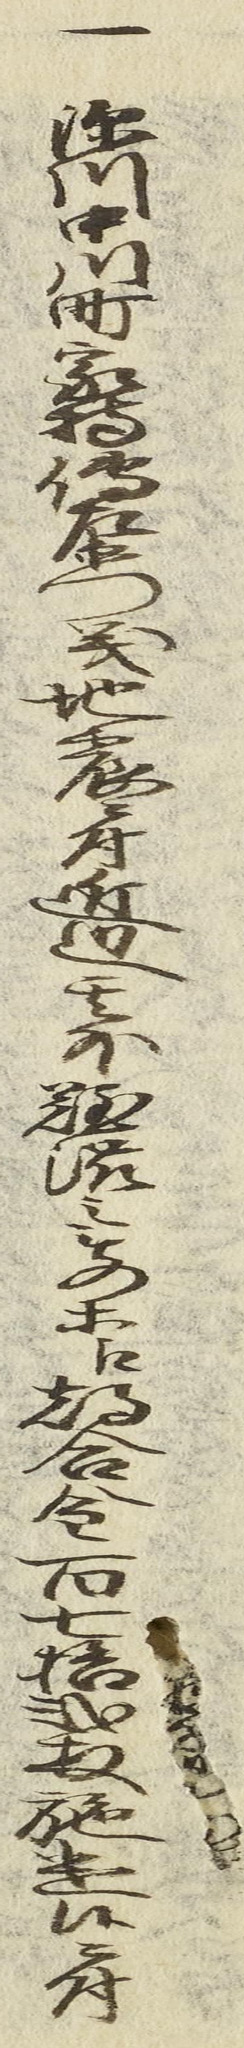一深川中川町家持伝左衛門義地震ニ付近辺其外難渋之もの等江都合金百七拾弐両施遣候ニ付
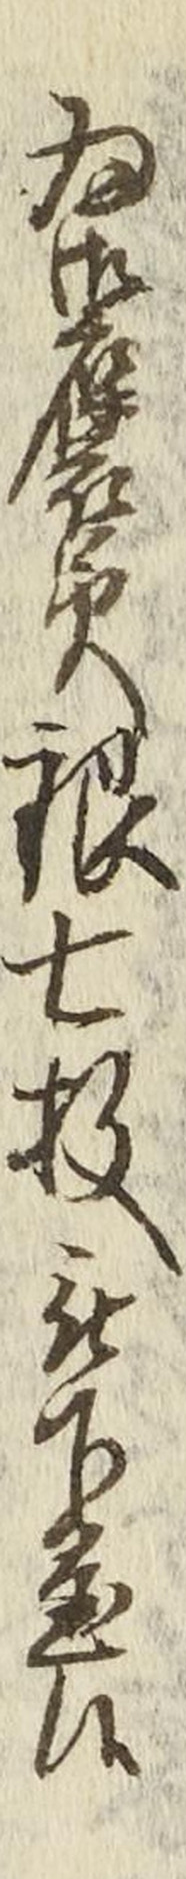為御褒美銀七枚被下置候
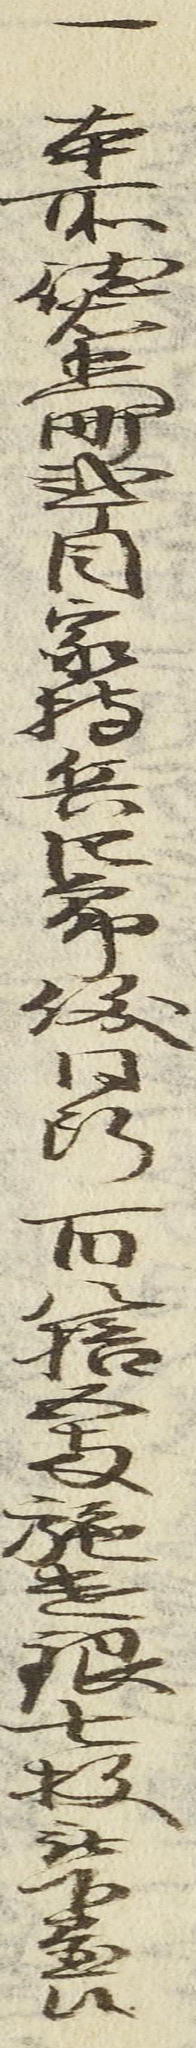一本所徳右衛門町弐丁目家持兵四郎儀同断百八拾五両施遣銀七枚被下置候
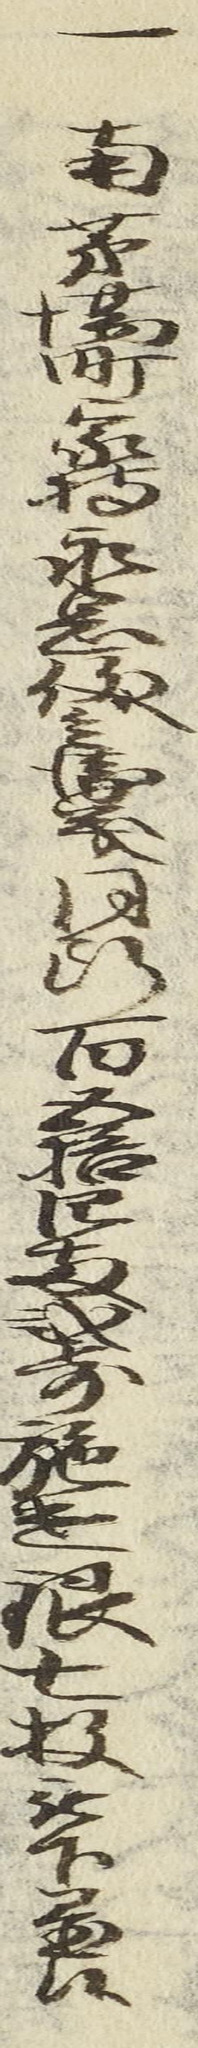一南茅場町家持永岡儀兵衛義同断百五拾四両弐歩施遣銀七枚被下置候
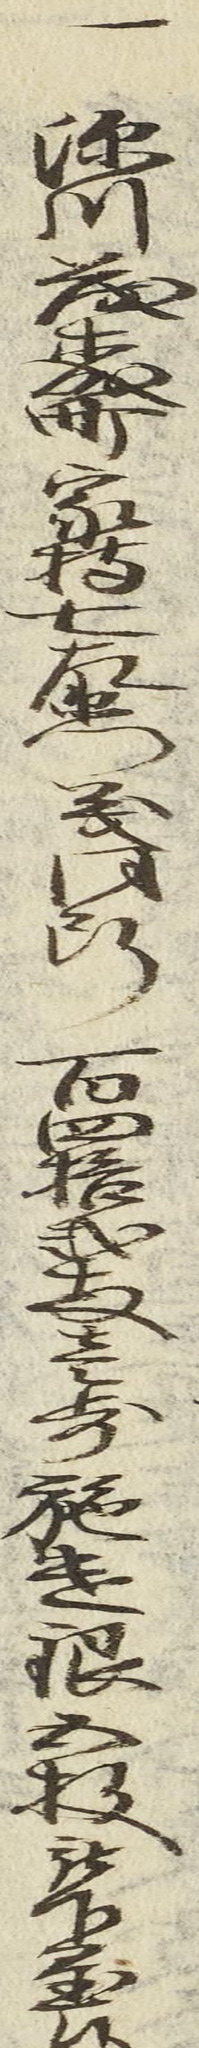一深川茂森町家持七左衛門義同断百四拾弐両壱歩施遣銀五枚被下置候
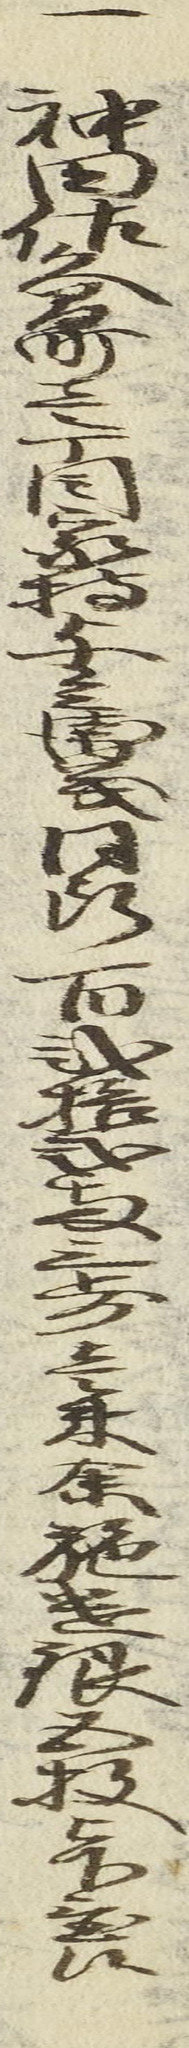一神田佐久間町壱丁目家持与兵衛義同断百弐拾弐両三歩壱朱余施遣銀五枚被下置候
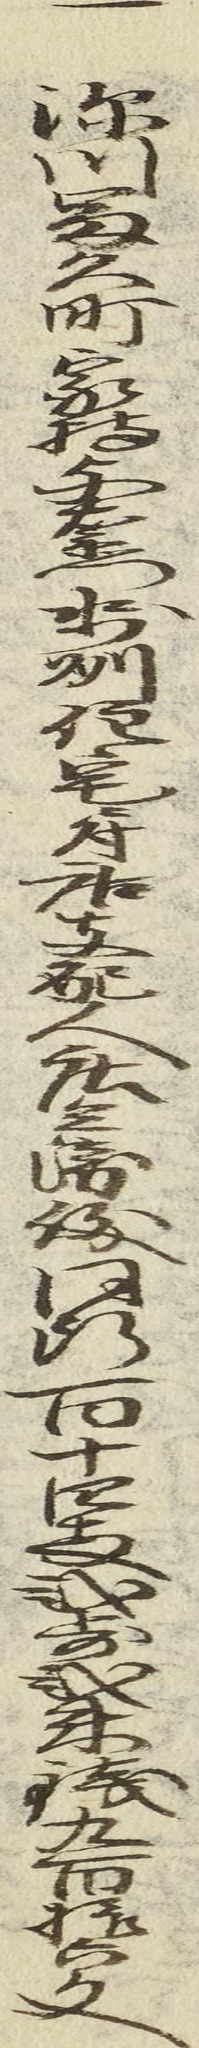一深川富久町家持与右衛門勢州住宅ニ付店支配人庄兵衛儀同断百十四両弐歩弐朱銭九百拾六文
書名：安政二年震災記事　完
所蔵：東京大学地震研究所図書室 Earthquake Research Institute Library, The University of Tokyo, JAPAN
